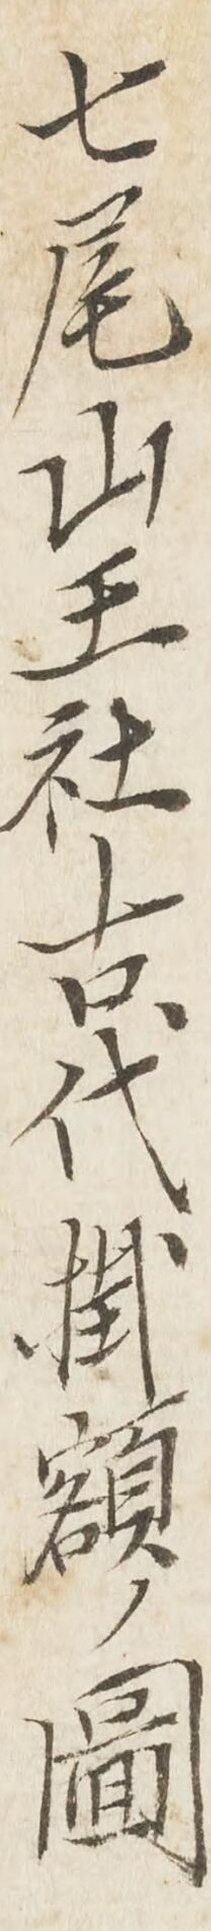七尾山王社古代掛額ノ図

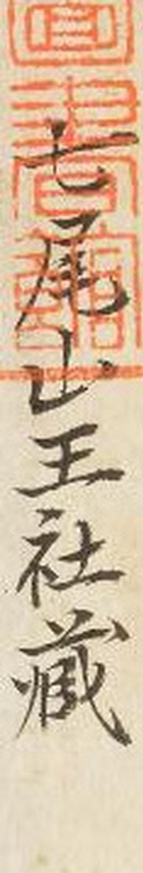七尾山王社蔵
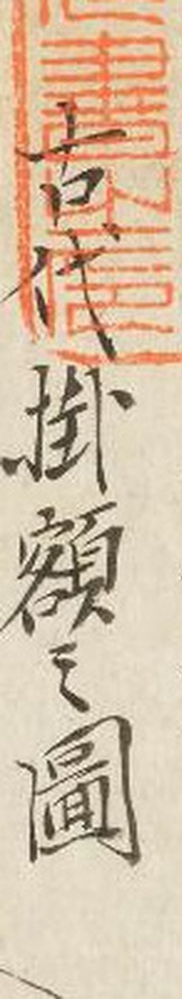古代掛額之図
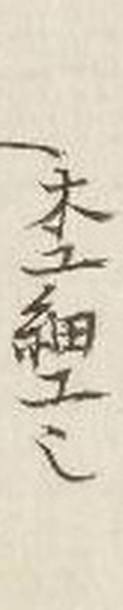木工細工也
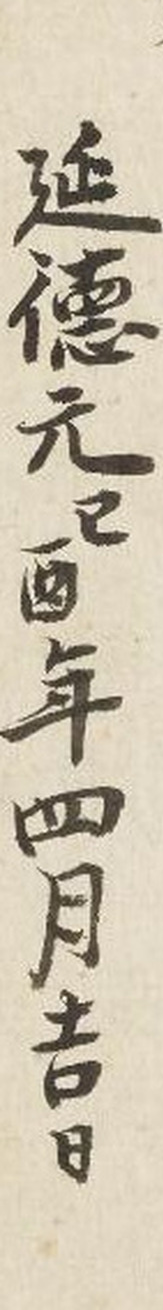延徳元己酉年四月吉日
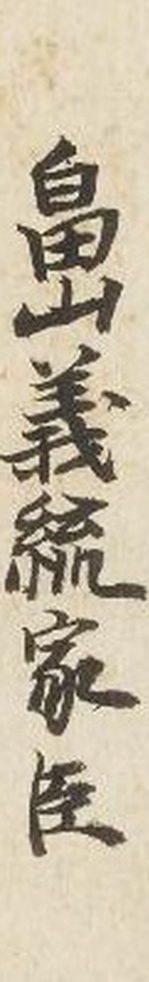畠山義統家臣
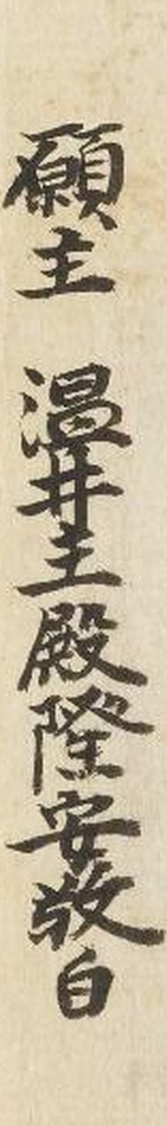願主温井主殿隆安敬白
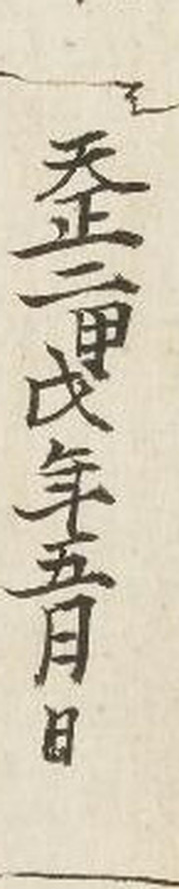天正二甲戊年五月日
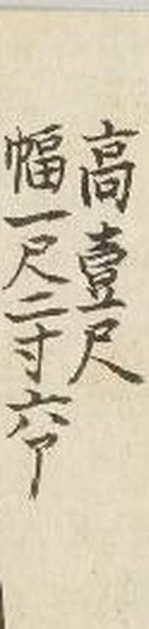幅一尺二寸六分
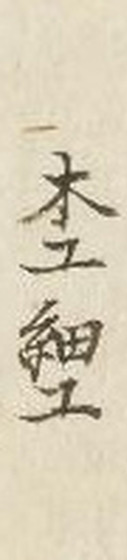木工細工
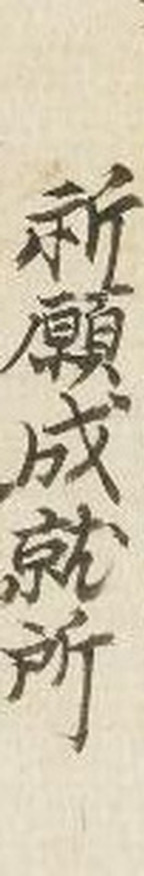祈願成就所
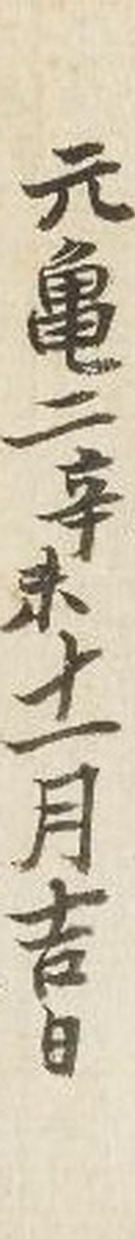元亀二辛未十一月吉日
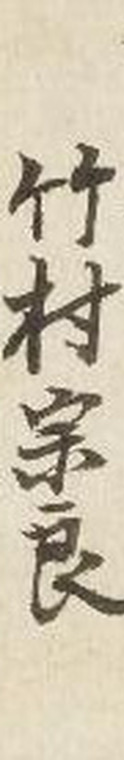竹村宗良
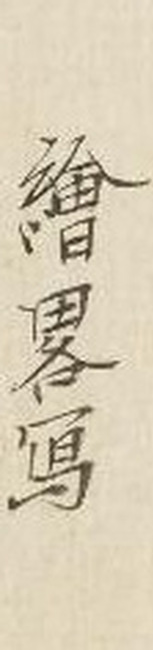絵略写
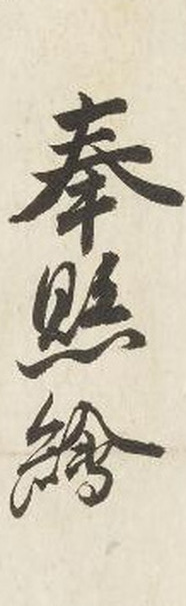奉懸絵
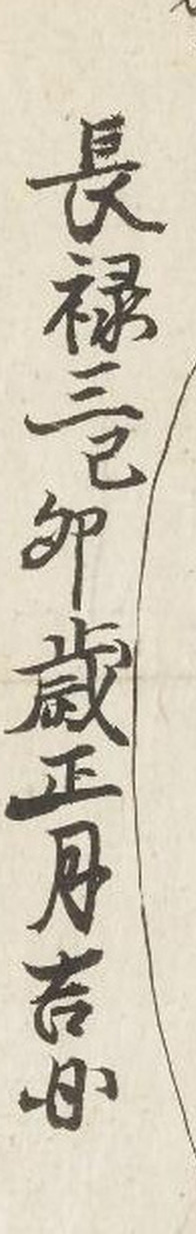長禄三己卯歳正月吉日
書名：七尾山王社古代掛額ノ図
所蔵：Ishikawa Prefectural Library
